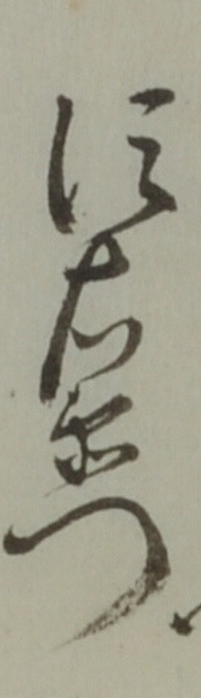同昼惣右衛門
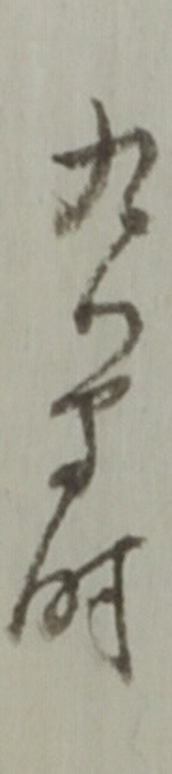九ツ半時
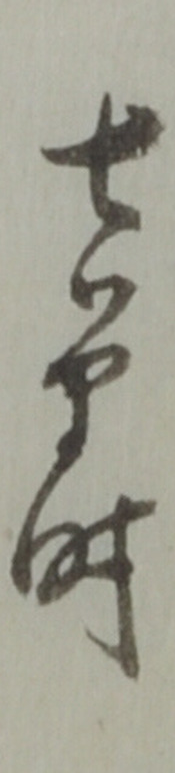七ツ半時
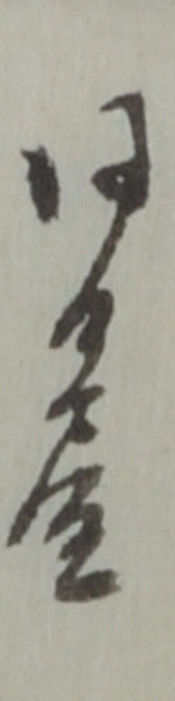同日昼
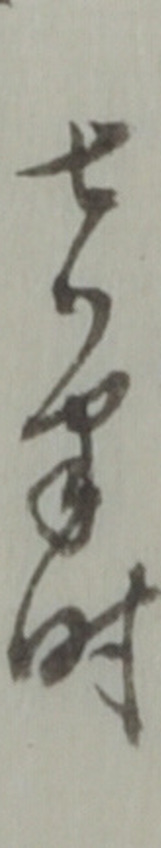七ツ半時
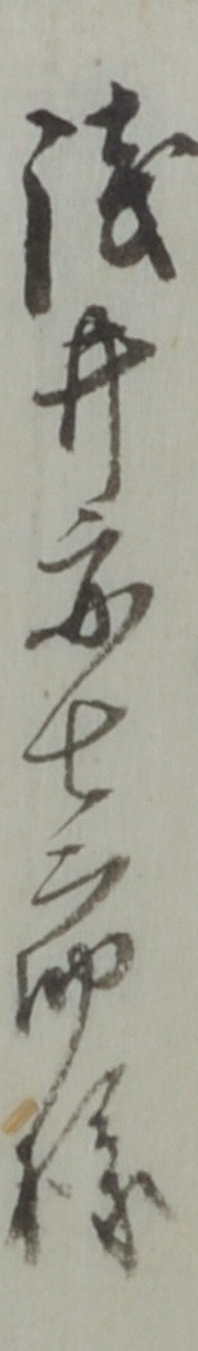浅井亦七郎様
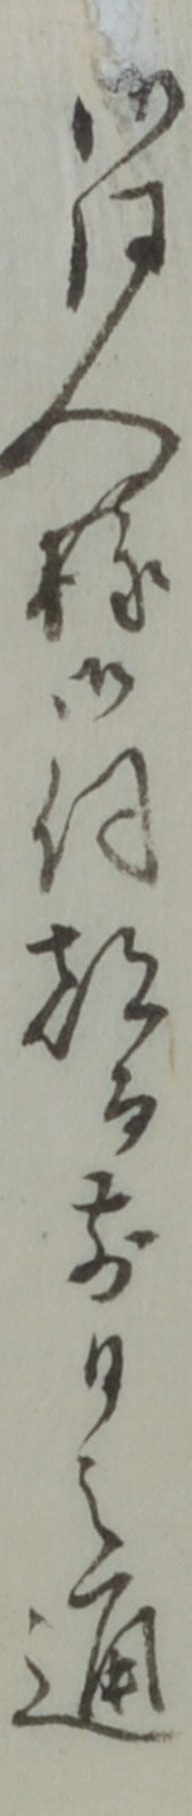御同人様御伺都而前日之通
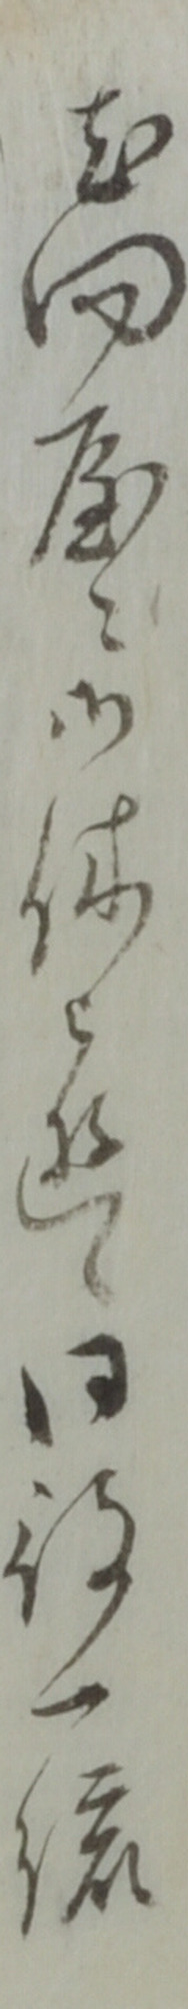尤向屋ニ御休被遊候同役一統
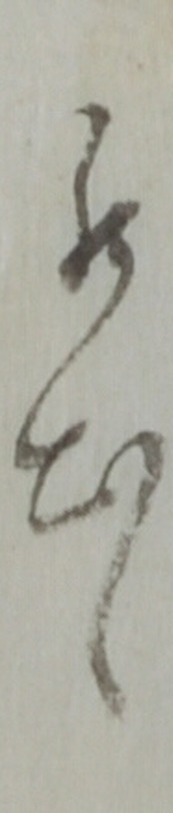罷出候

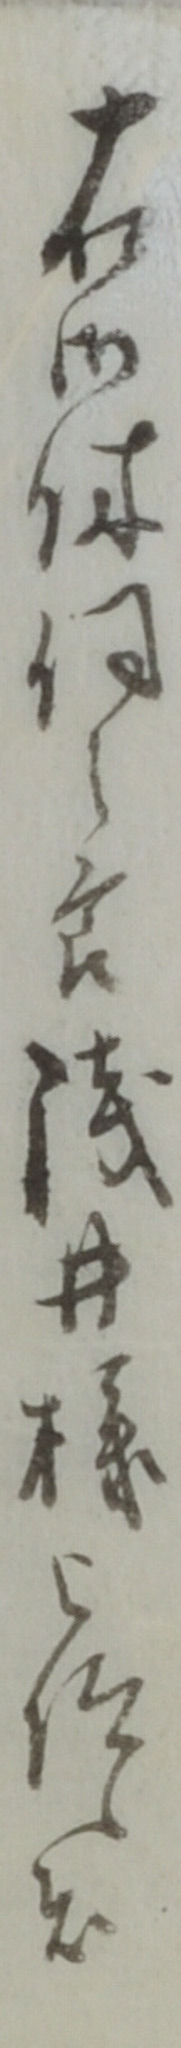右御休伺之節浅井様被仰候者
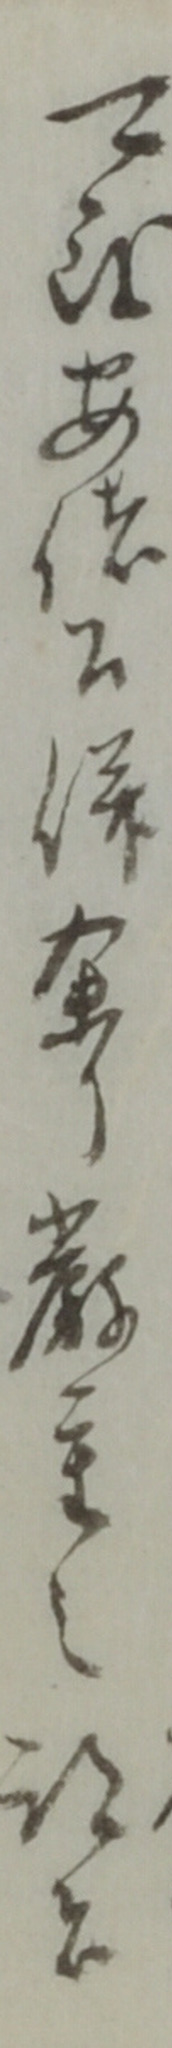可致安堵間併余リ厳重之跡者
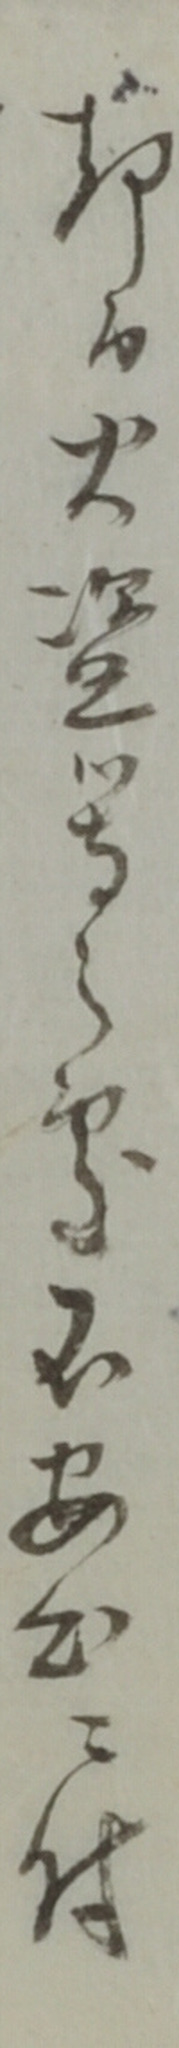却而火盗等之処不安心ニ付
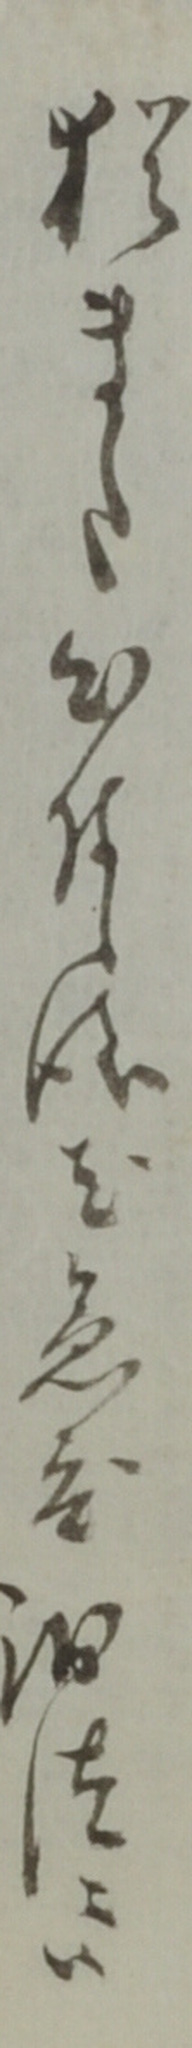猶また心付候様尤急度沙汰ニハ
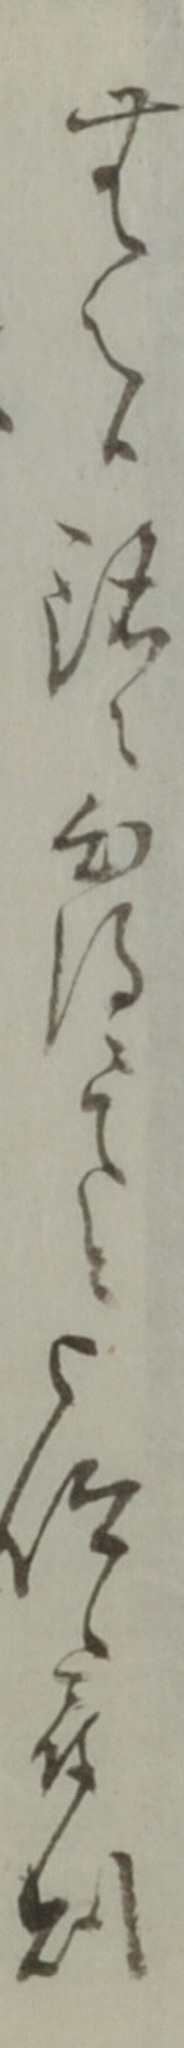無之候銘々心得ニてと被仰候ニ付則
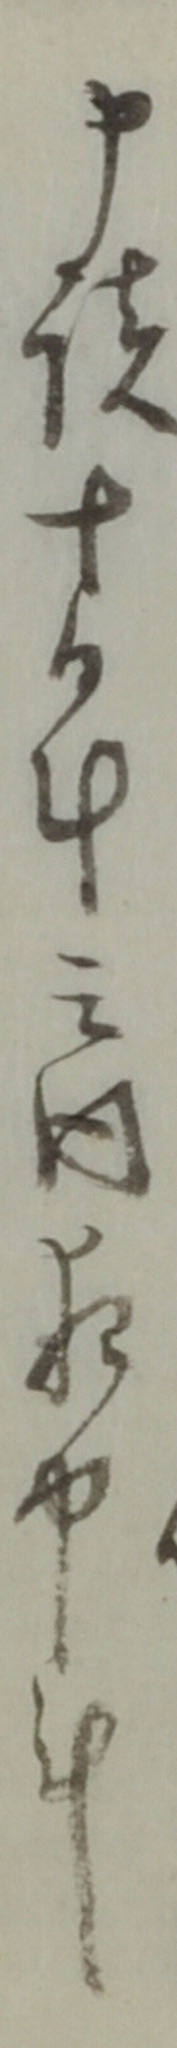申談十日斗之内夜中至候
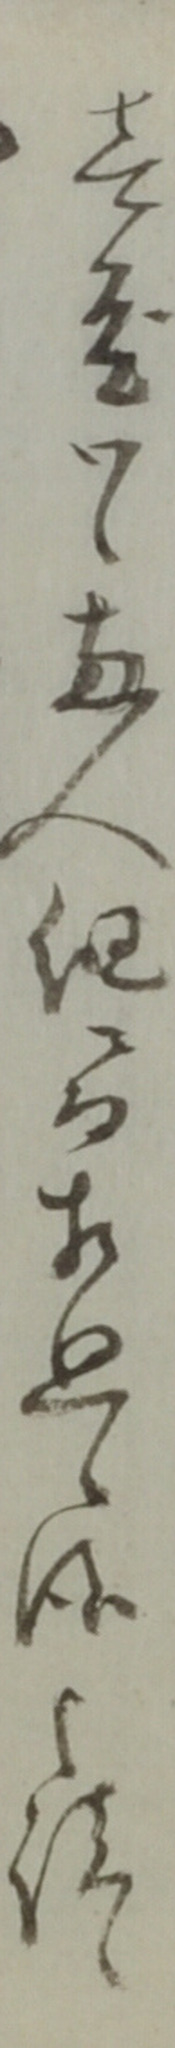壱度ツヽ両人組ニ而相廻候様被請候
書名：日光御参詣ニ付町方警固番割名前控
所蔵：伊那市立高遠町図書館・合同会社AMANE
